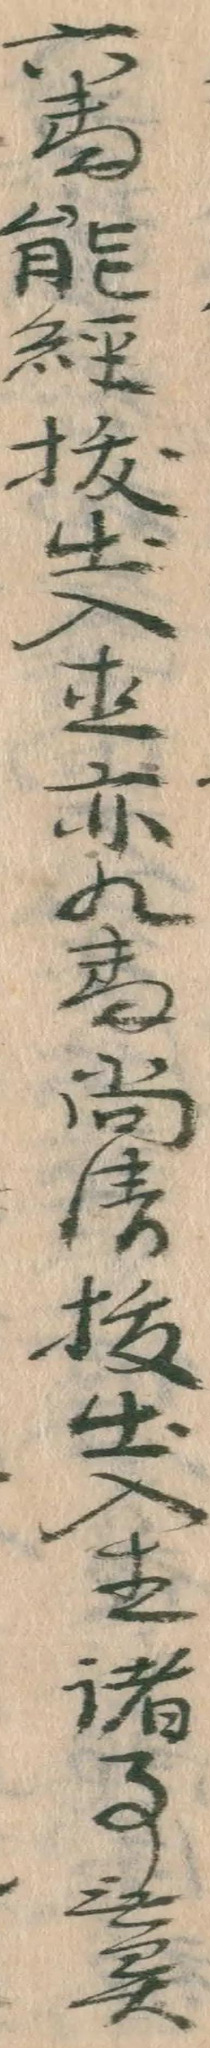六番能経抜出入直亦九番尚清抜出入直諸事無異
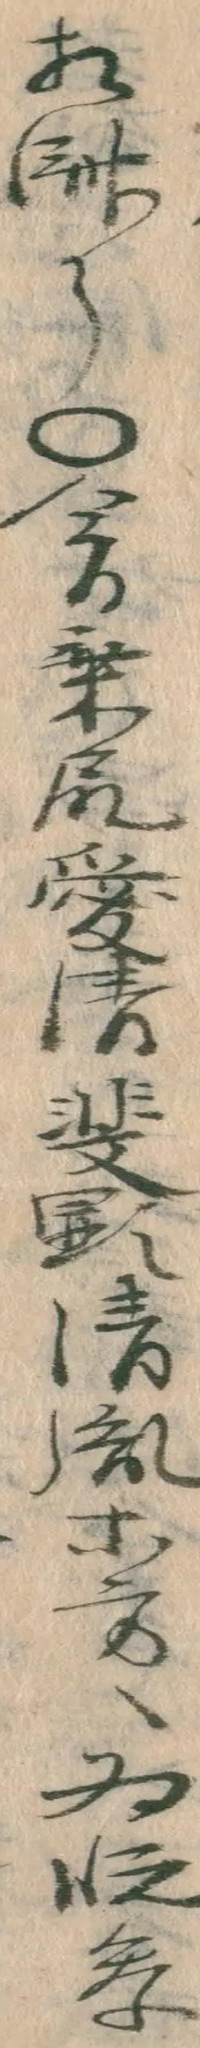相済候○今日乗尻愛清斐顕清胤等方へ為悦参
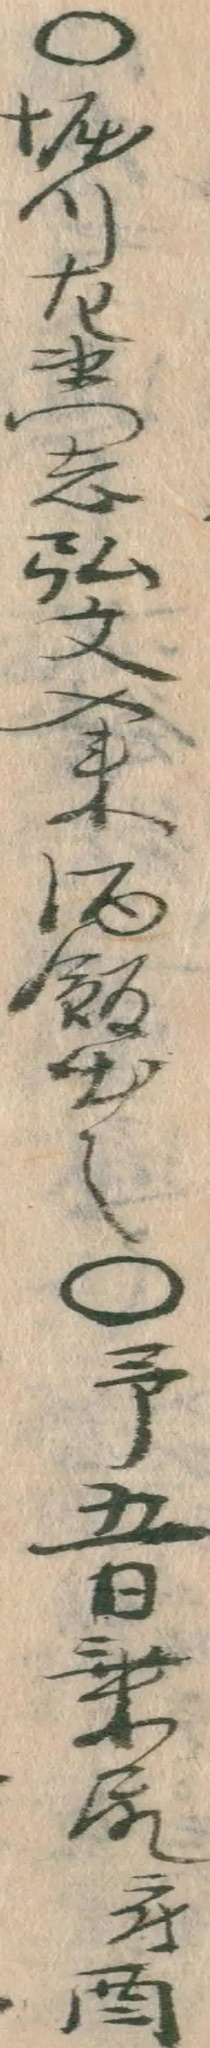○堀川左衛門志弘文入来酒飯出也○予五日乗尻ニ付酉
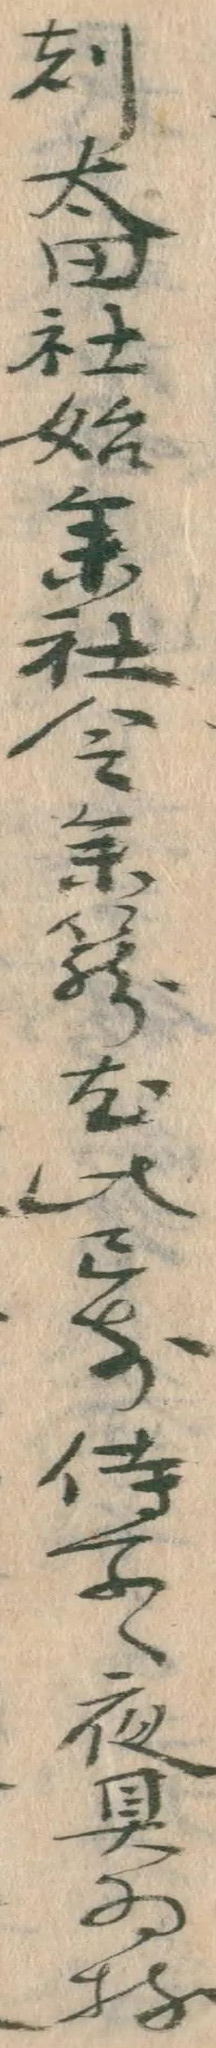刻太田社始参社令参籠尤此已前侍所へ夜具為持
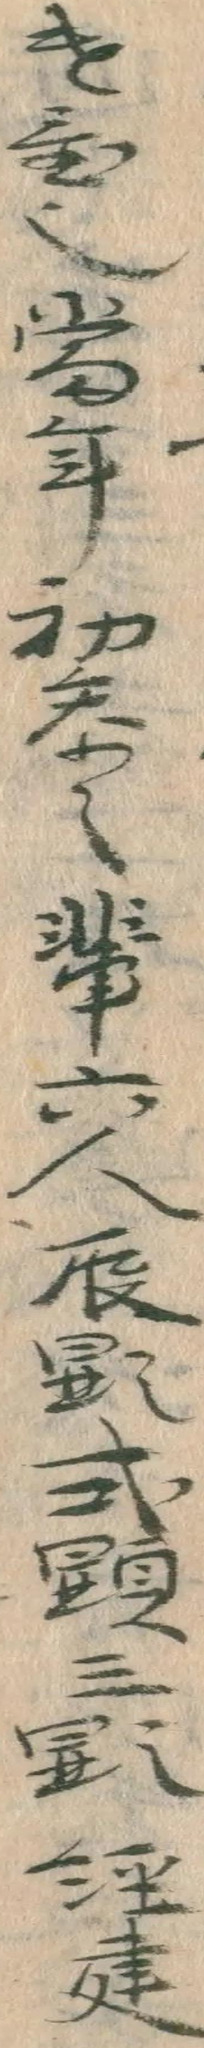遣置也當年初参之輩六人辰顕式顕三顕経建
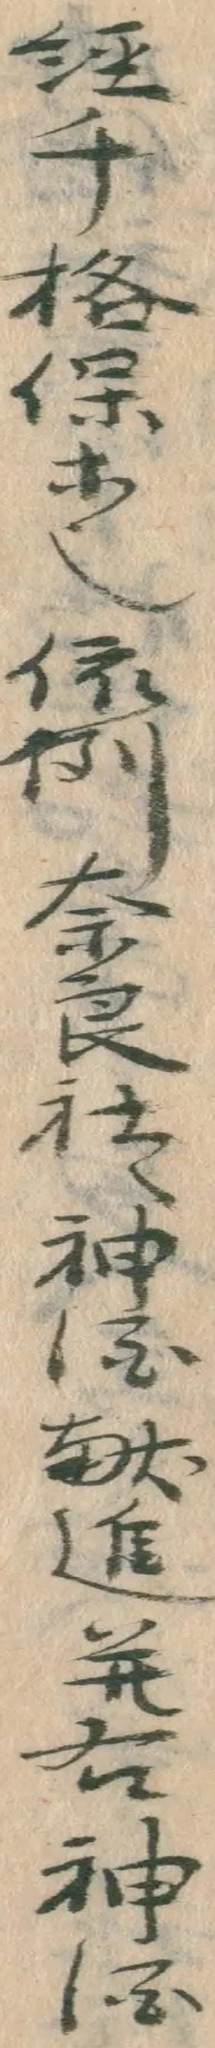経千格保等也依例奈良社へ神酒献進并右神酒
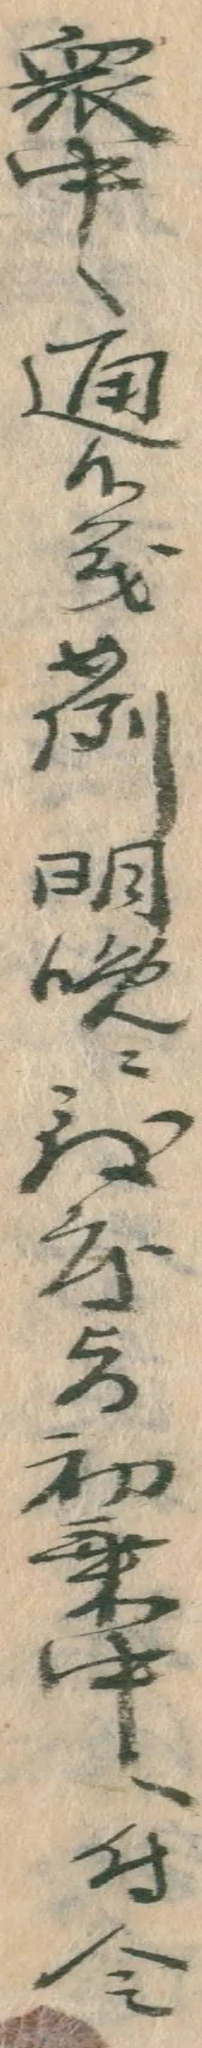衆中ヘ通候義如例明晩に致度旨初乗中へ付今
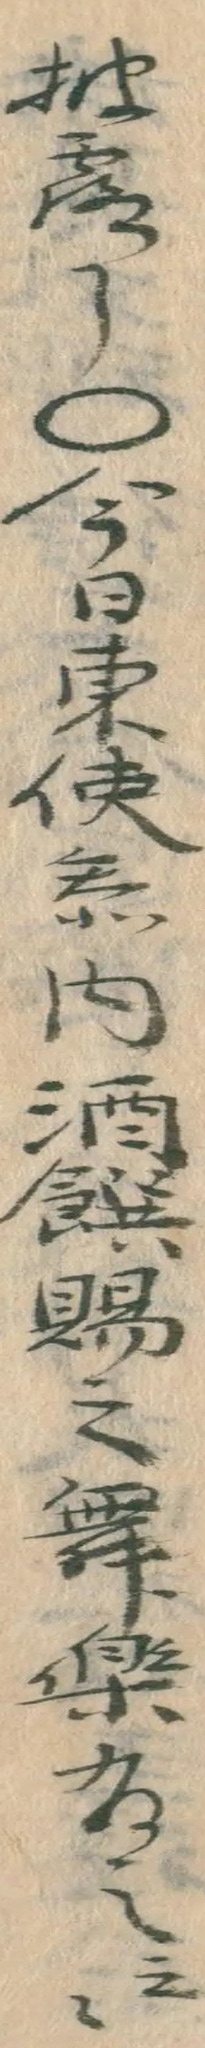披露了○今日東使参内酒饌賜之舞楽有之云々
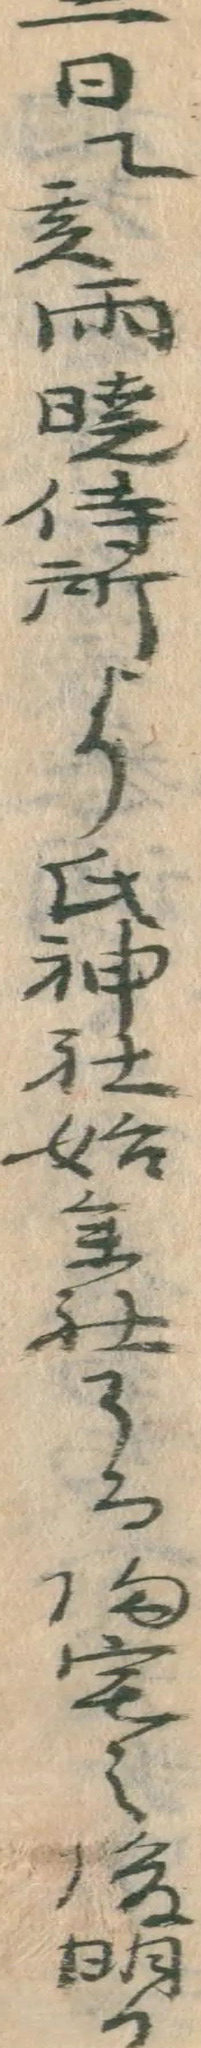二日乙亥雨暁侍所より氏神社始参社了而帰宅之後明日
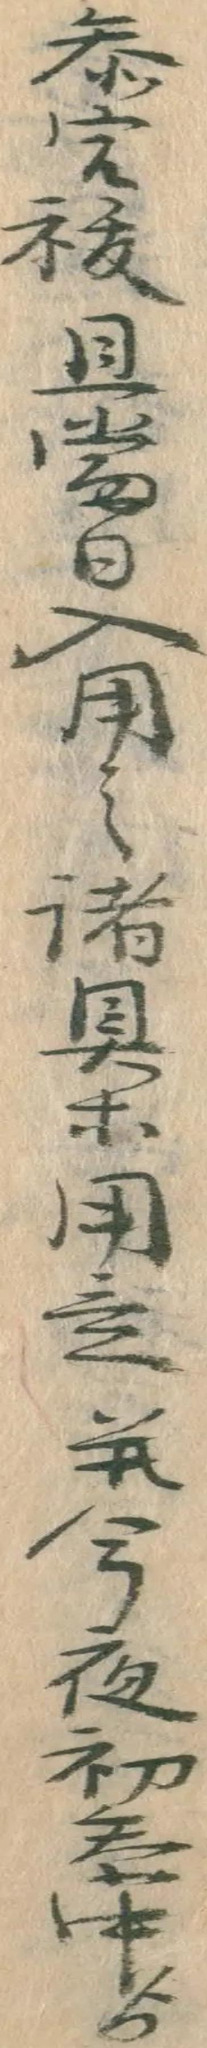参宮祓且當日入用之諸具等用意幷今夜初参中ゟ

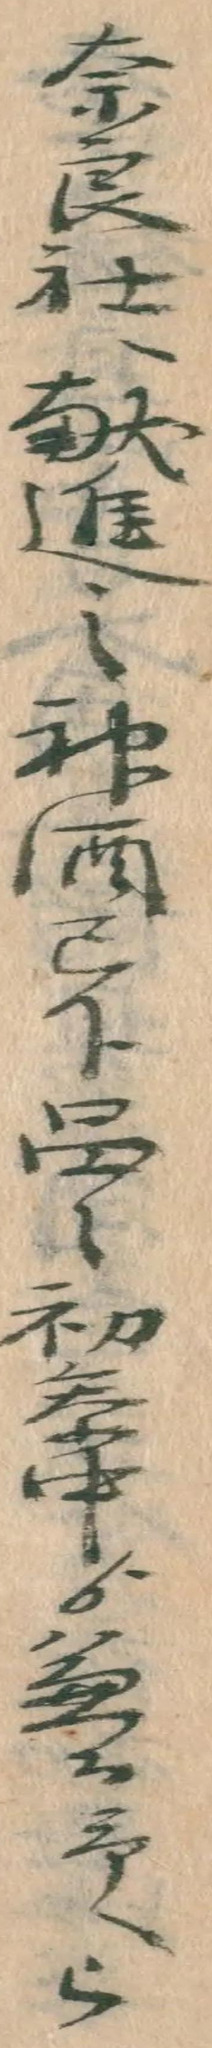奈良社へ献進也神酒已下品々初乗中ゟ兼而予へ被
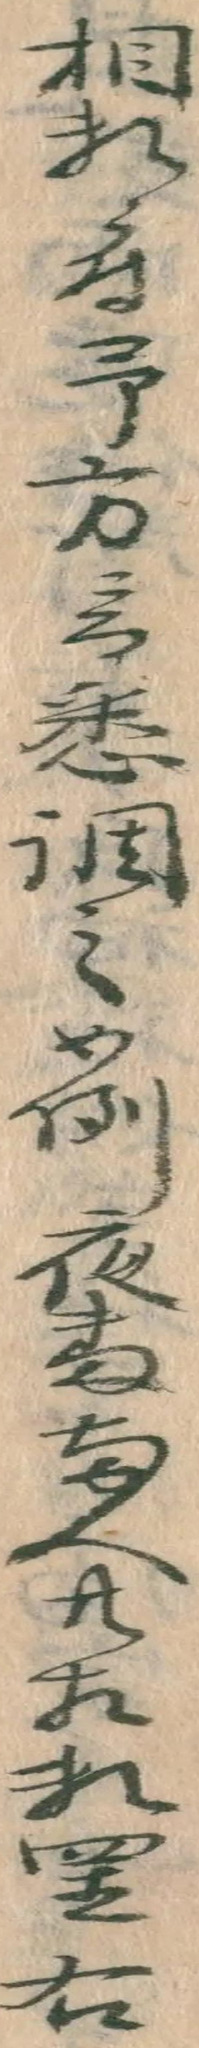相頼ニ付予方ニ而悉調之如例夜番両人共相頼置右
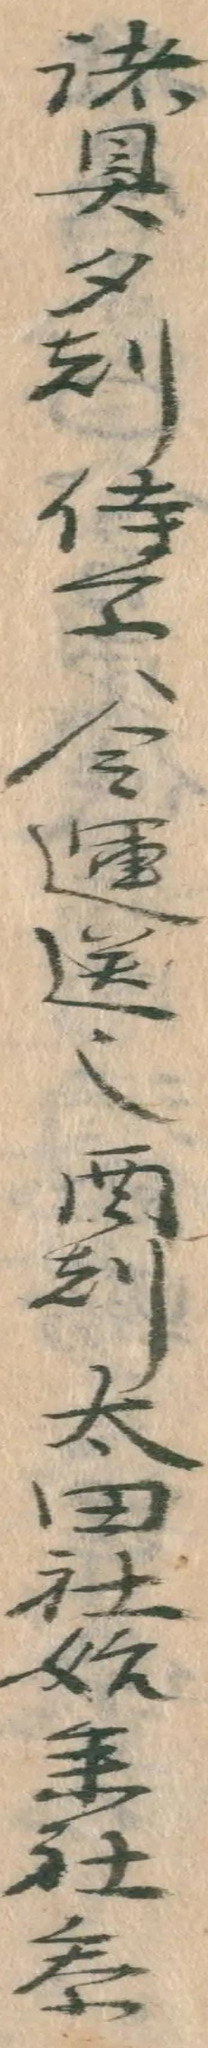諸具夕刻侍所へ令運送也酉刻太田社始参社参
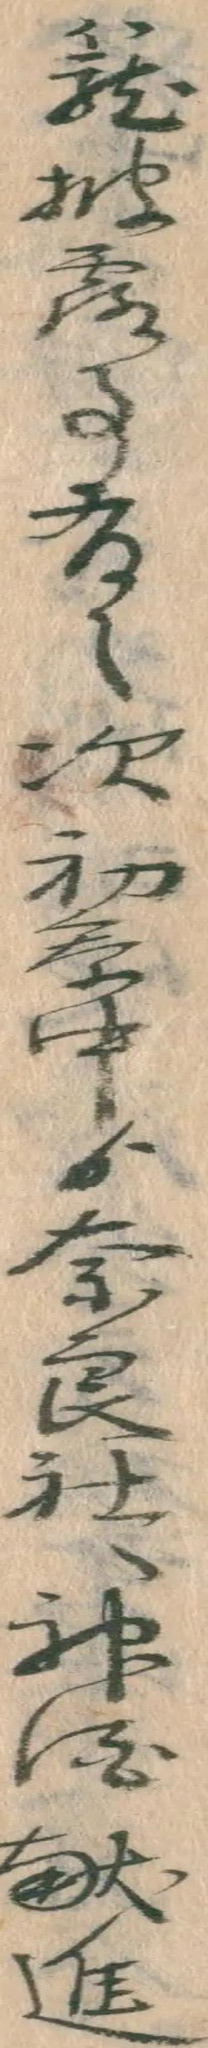籠披露事有之次初乗中ゟ奈良社へ神酒献進
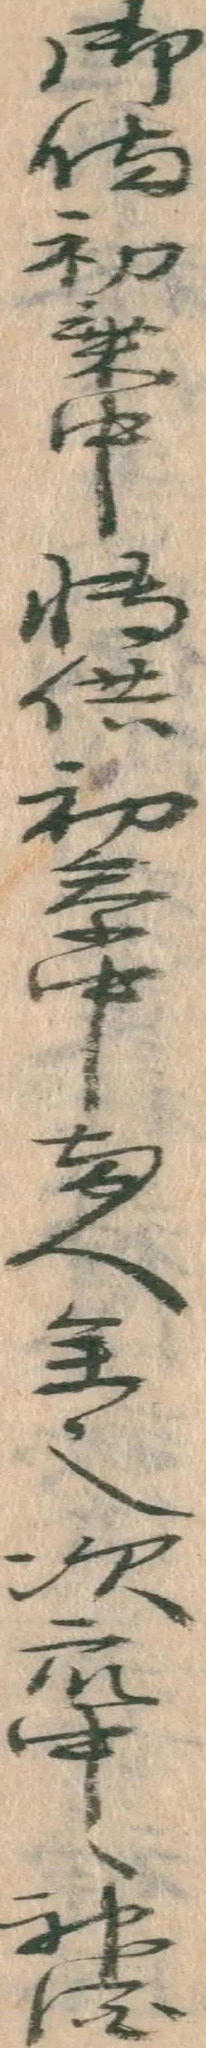御備初乗中轉供初乗中両人参也次衆中へ神酒
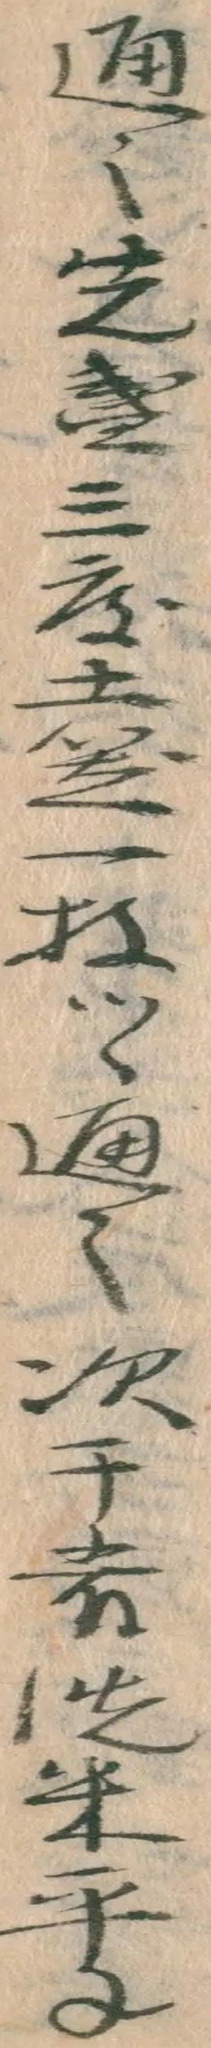通之先盞三度土器一枚ツヽ通也次干肴洗米平手
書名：賀茂社記録. 第63冊
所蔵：国立国会図書館 National Diet Library, JAPAN
